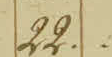22.
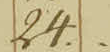24.
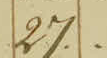27.
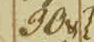30
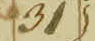31
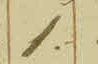1.
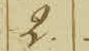2.
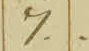7.
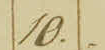10.
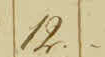12.
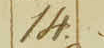14.
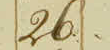26.
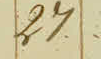27.
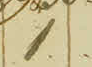1.
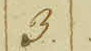3.
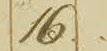16.
